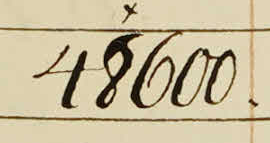48600
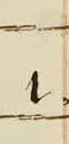1
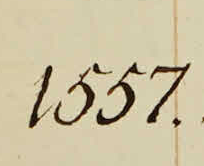1557
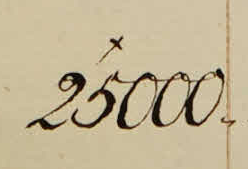25000
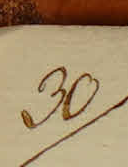30
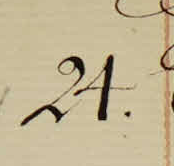24.
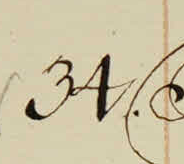34.
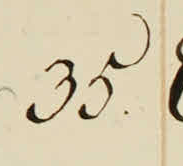35.
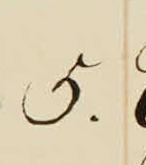5.
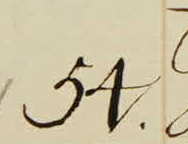54.
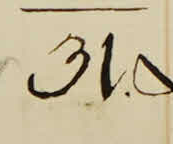31.
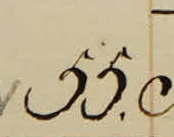55.
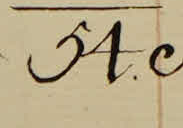54.
